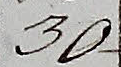30
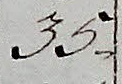35
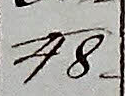48
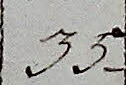35
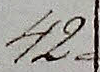42
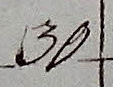30
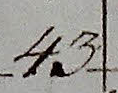43
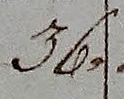36
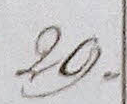29
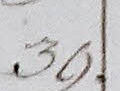39
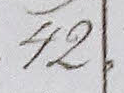42
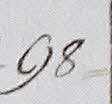98
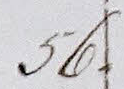56
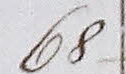68
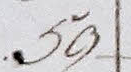59
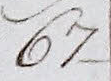67
